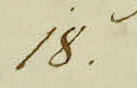18.
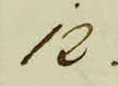12
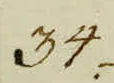34
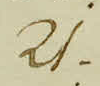21
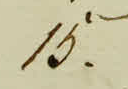15.
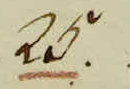25.
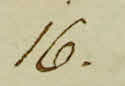16
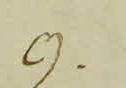9.
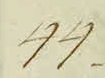44
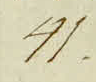41
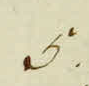5
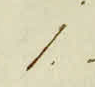1
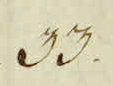33
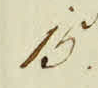15
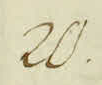20
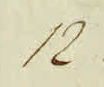12
